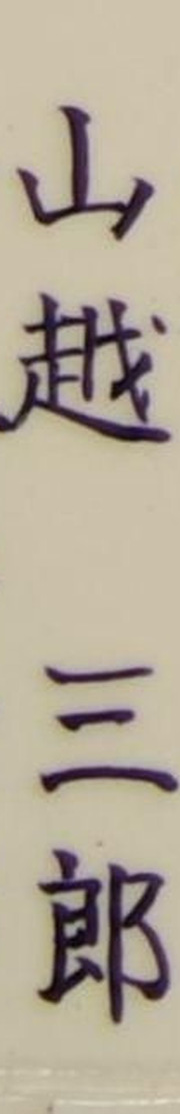山越三郎
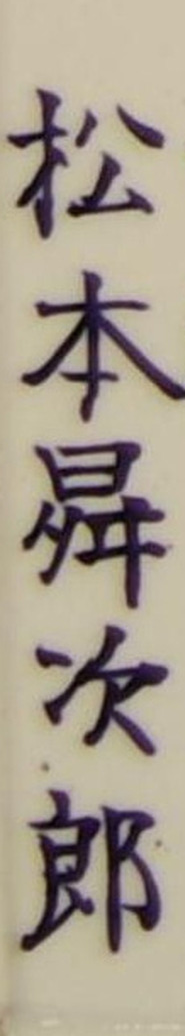松本昇次郎

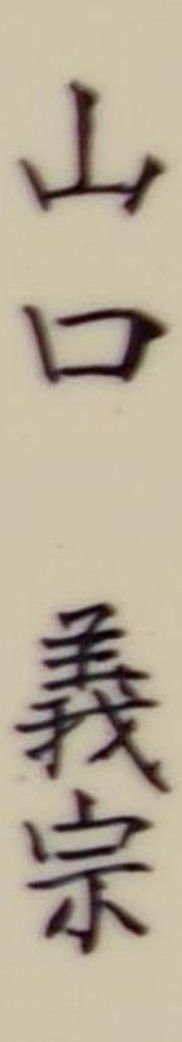山口義宗
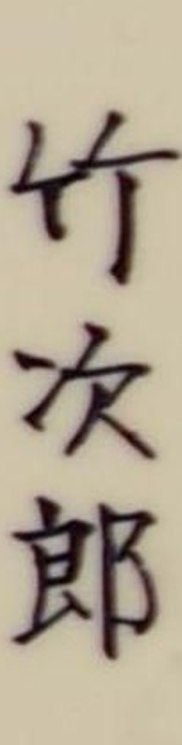竹次郎
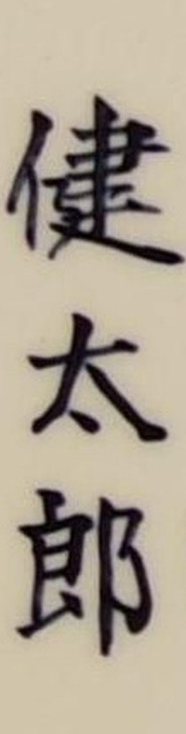健太郎
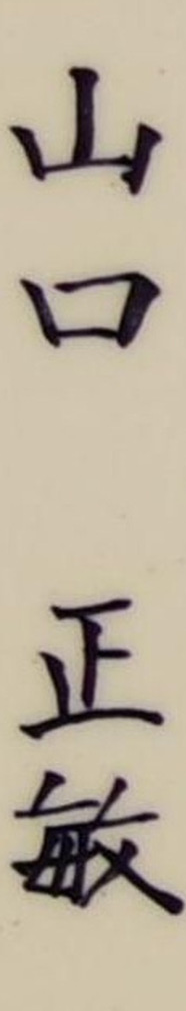山口正敏

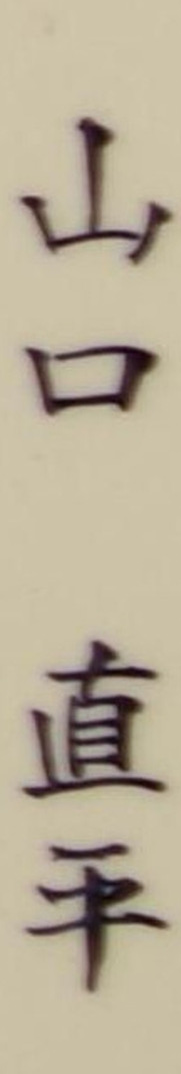山口直平
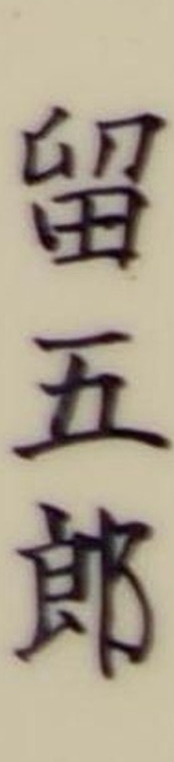留五郎
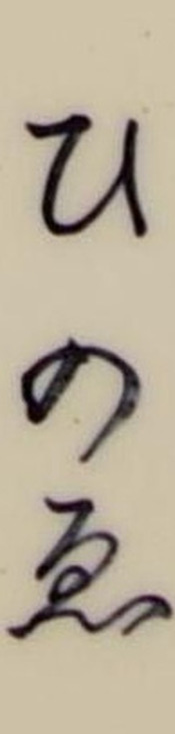ひのゑ
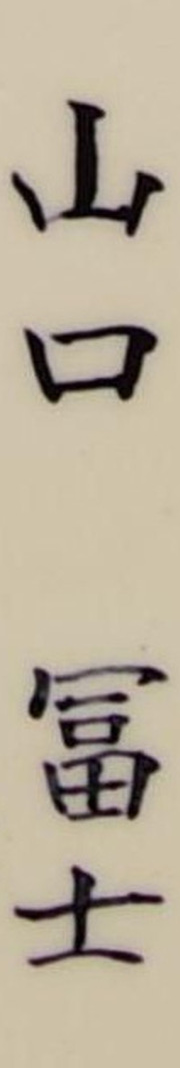山口冨士
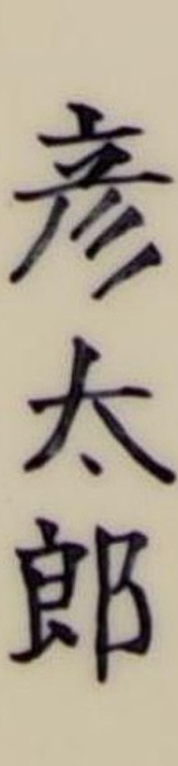彦太郎
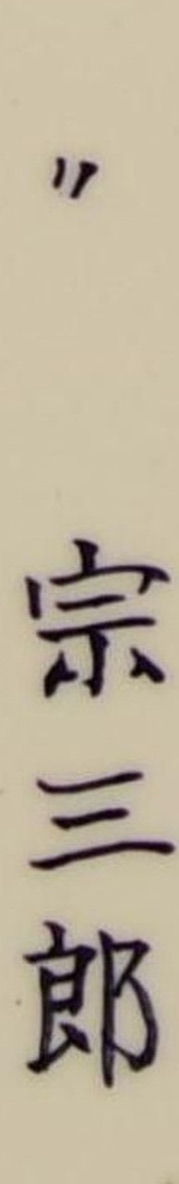宗三郎
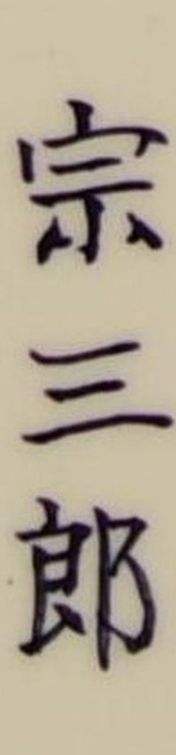宗三郎
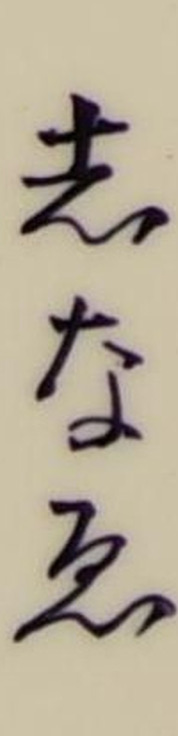しなゑ
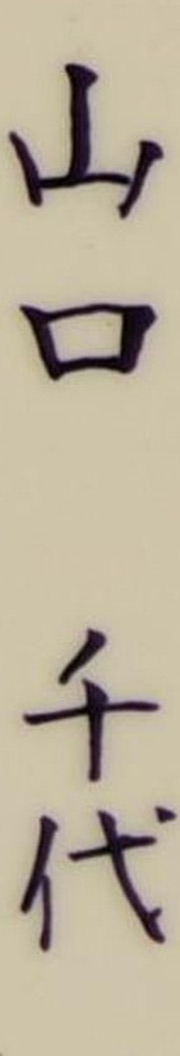山口千代

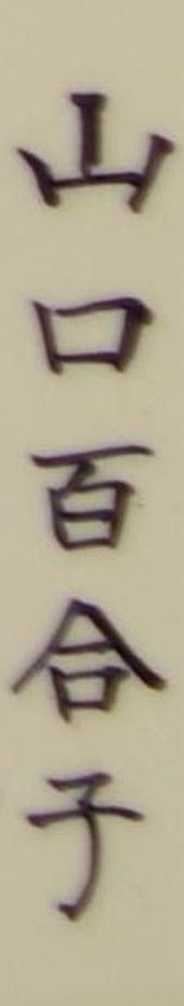山口百合子
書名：A~D
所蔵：koyasan kongobuji
